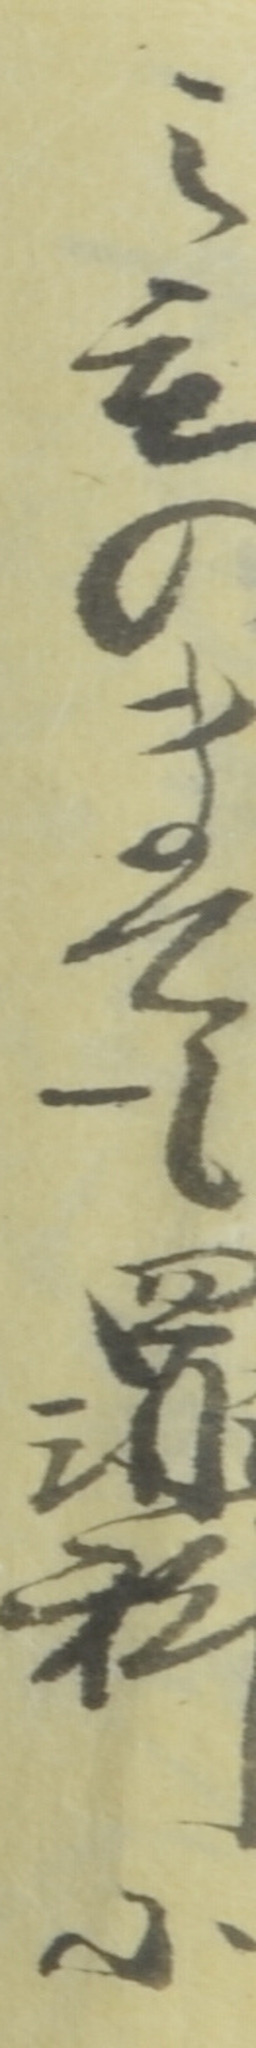之ものまても罪科に
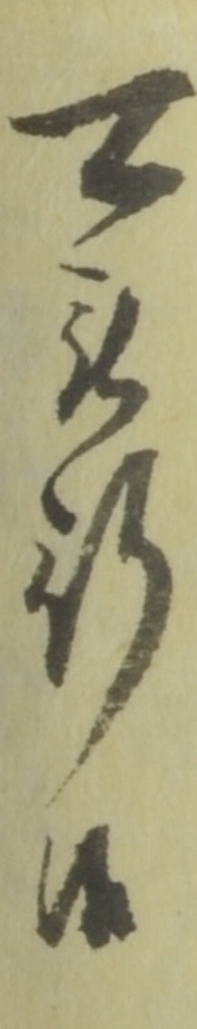可被行候
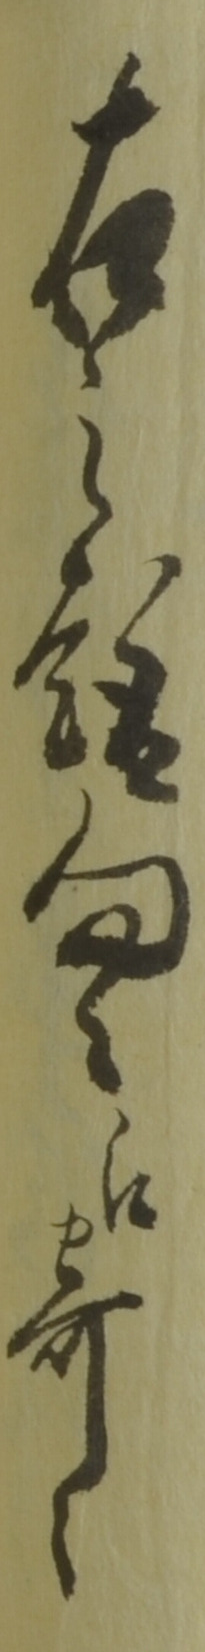右之趣向々江奇々
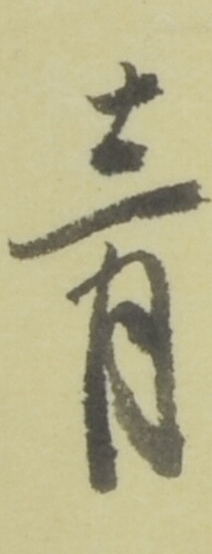十二月
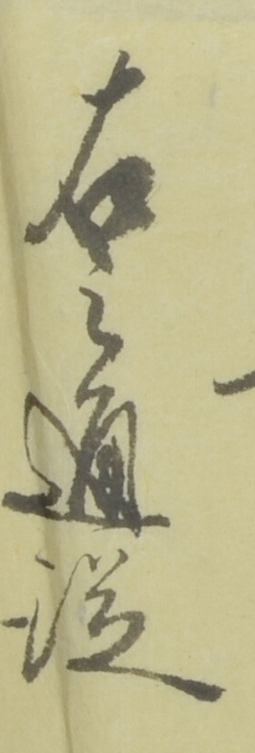右之通従
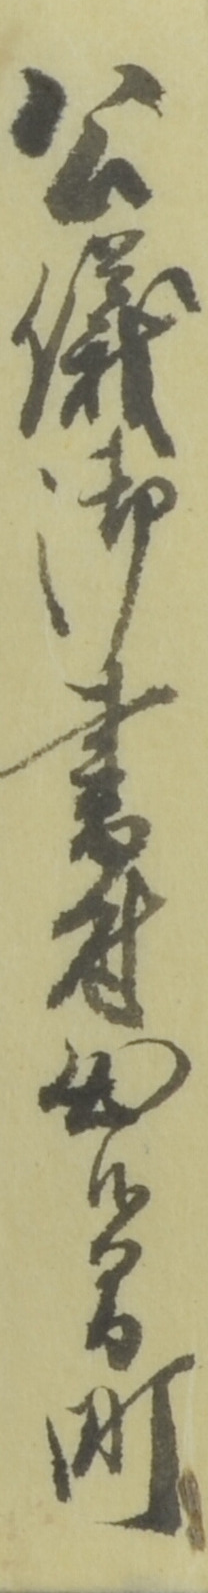公儀御書付出候間町
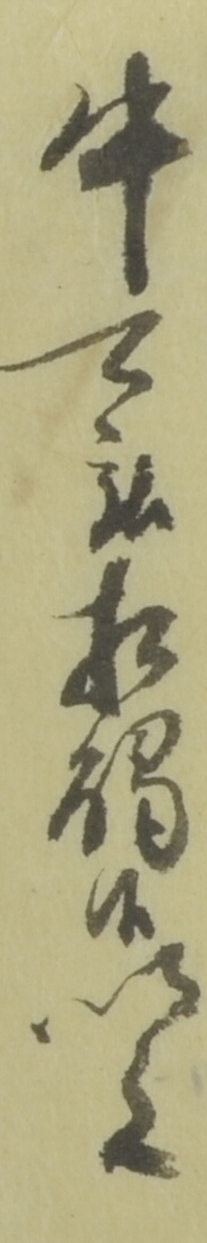中可被相触候以上
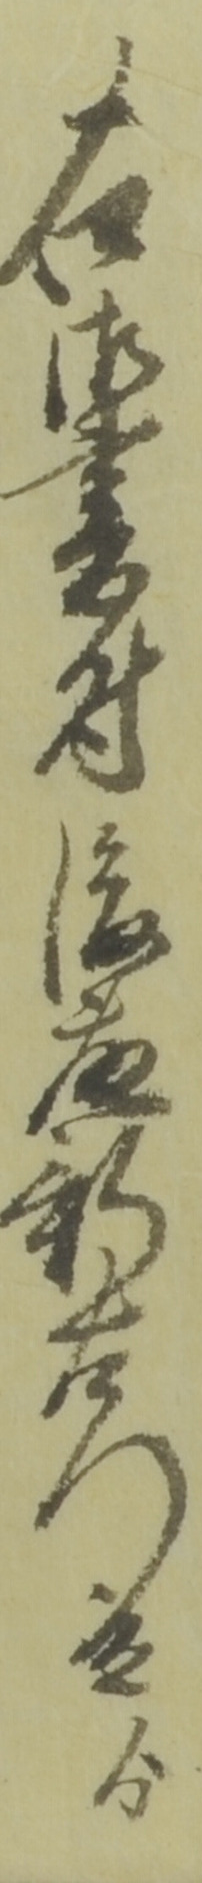右御書付後藤新右衛門殿ゟ
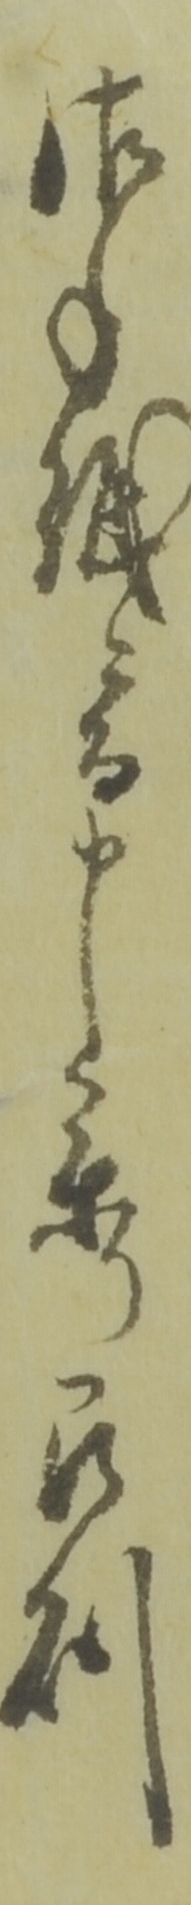御手紙ニ而申参り則
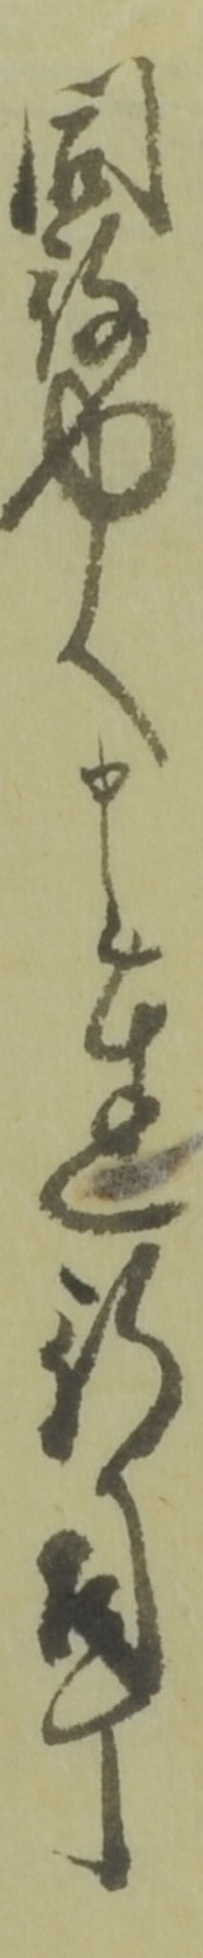同役中へ申達行司丁
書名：御触書御書附控
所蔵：伊那市立高遠町図書館・合同会社AMANE
